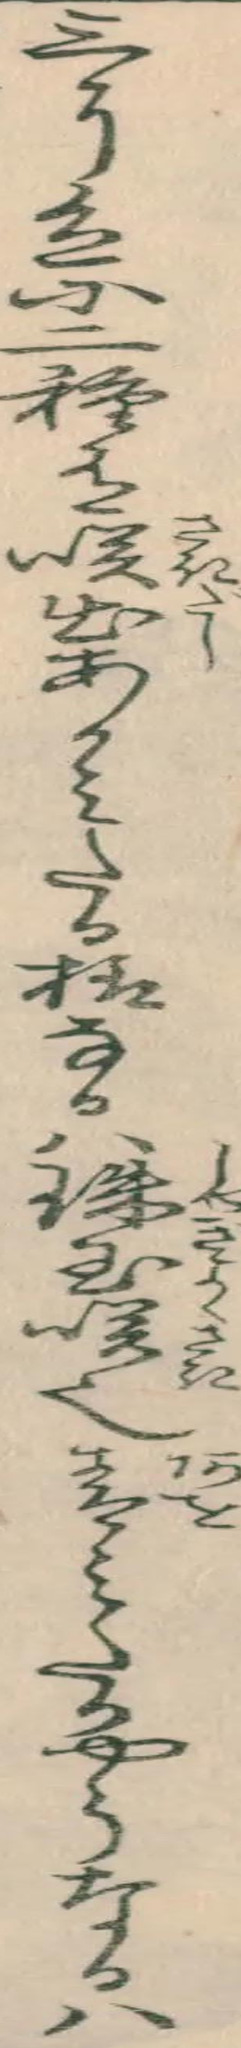三に色に二種有咲出あかみたる様なるは珠玉咲也青みたかやうなるは
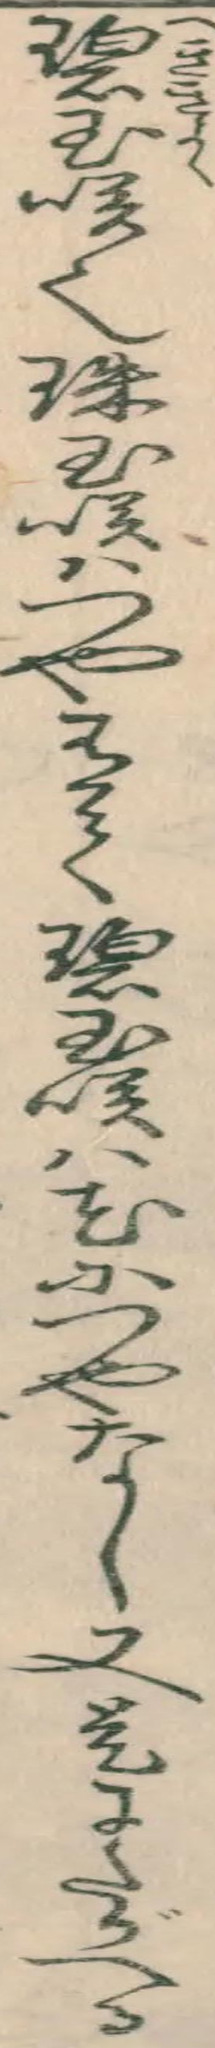碧玉咲也珠玉咲はつや有て碧玉咲は花につやなし又是にたがへる
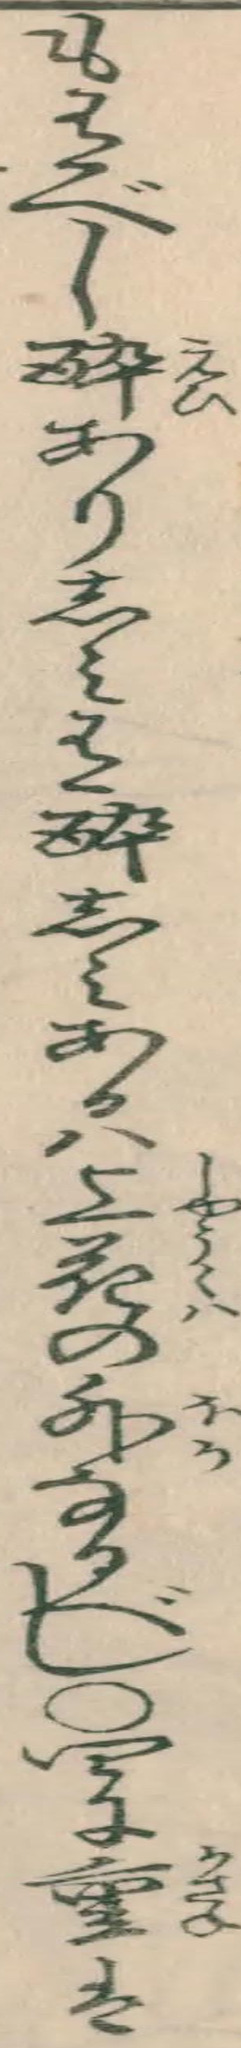も有べし酔ありしみ有酔しみあるは上花の外なるべし○四に重は
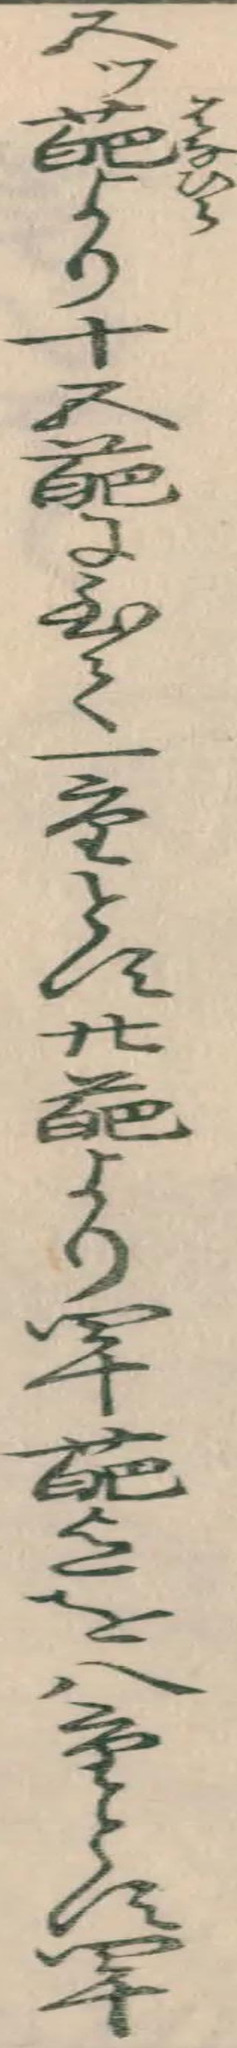五ッ葩より十五葩に至て一重とす廿葩より四十葩迄を八重とす四十
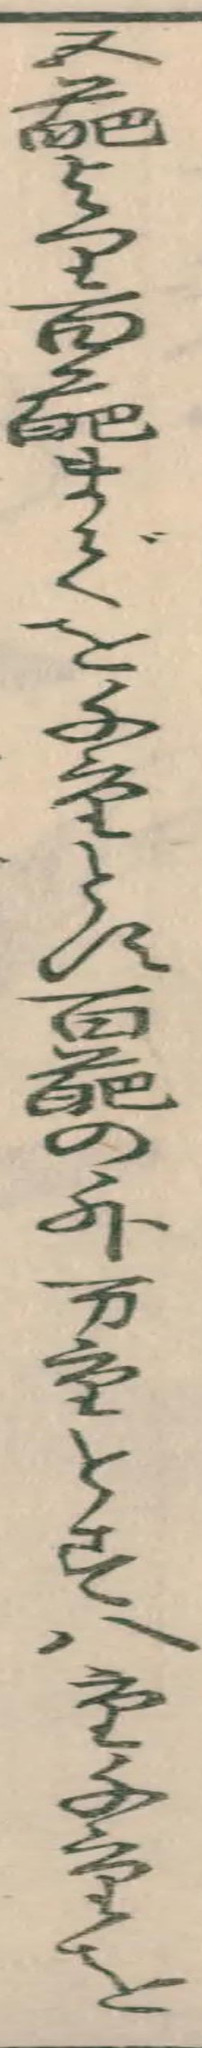五葩より百葩までを千重とす百葩の外万重とす八重千重を
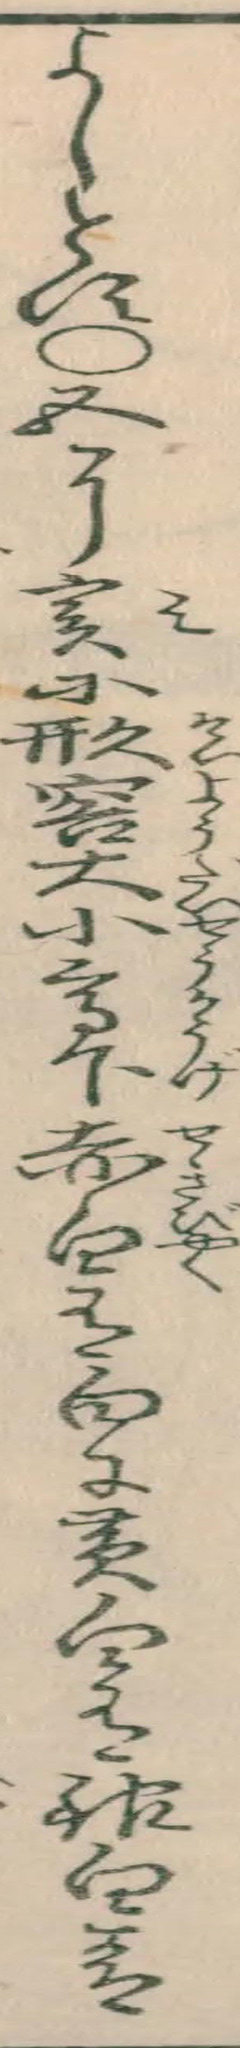よしとす○五に実に形容大小高下赤白有白に黄白有銀白青
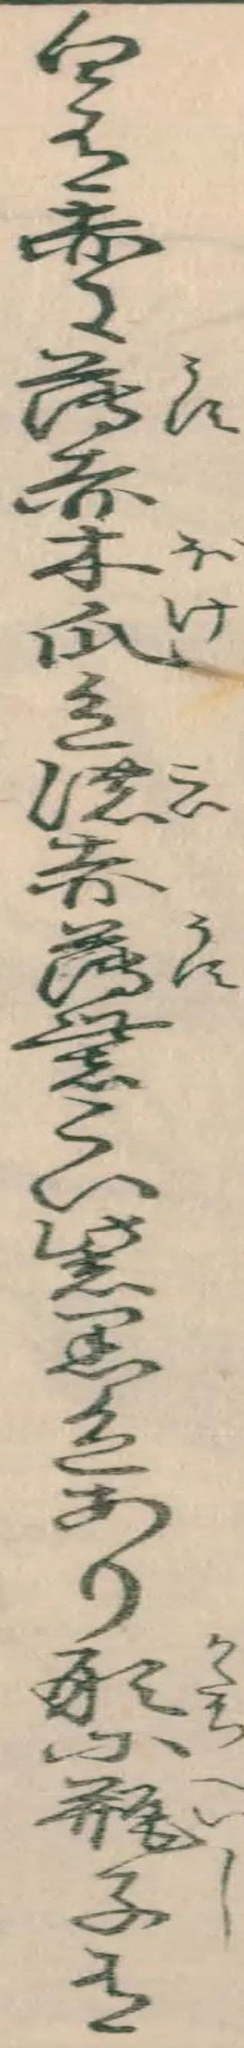白有赤に薄赤木瓜色濃赤薄紫こい紫黒色あり形に瓶子有
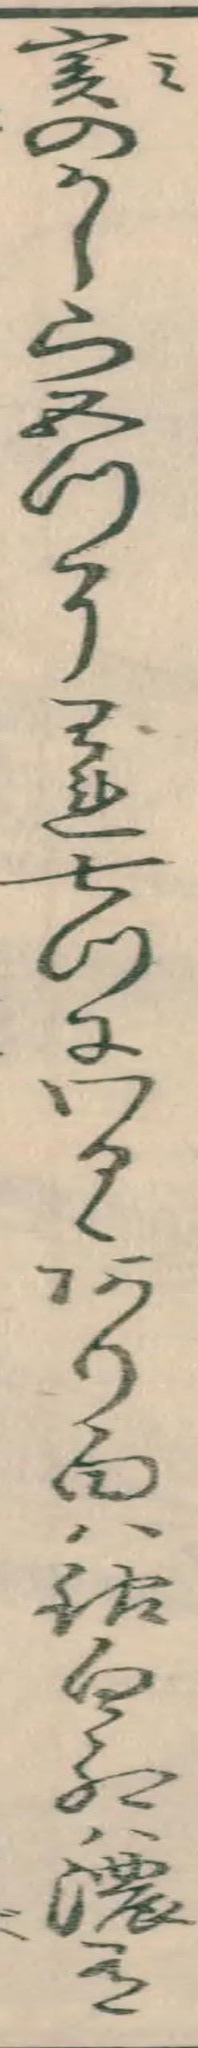実のかしら五つにわれ七つにわるゝあり白は銀白紅は濃有
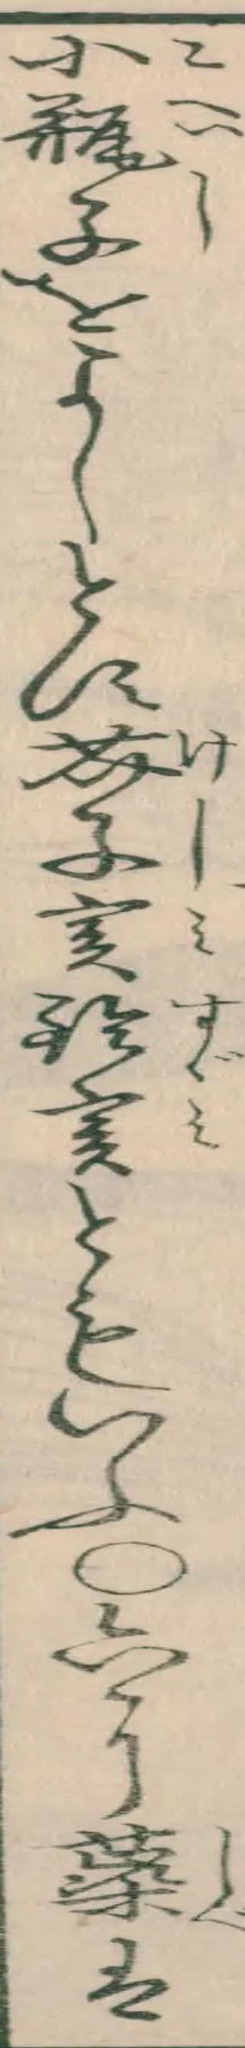小瓶子をよしとす芥子実鈴実ともいふ○六に蕊は
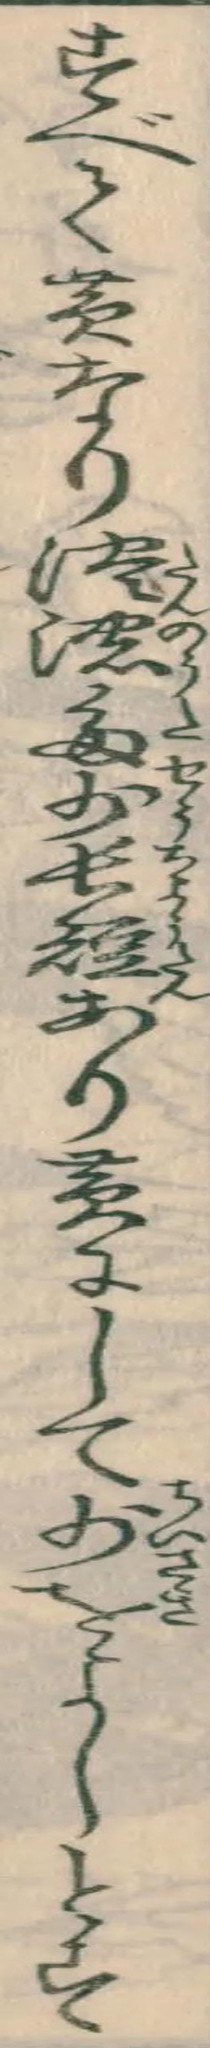すべて黄なり淡濃多少長短あり黄にして少をよしとす
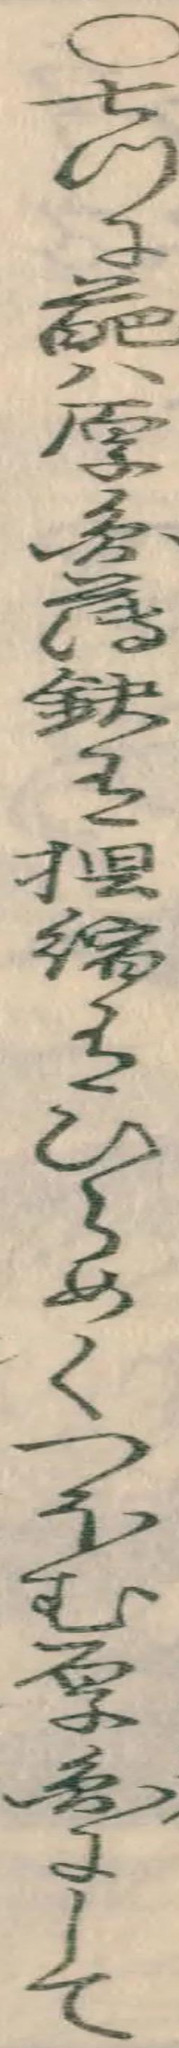○七つに葩は厚円薄鈌有縮有ひらめくつほむ厚円にして
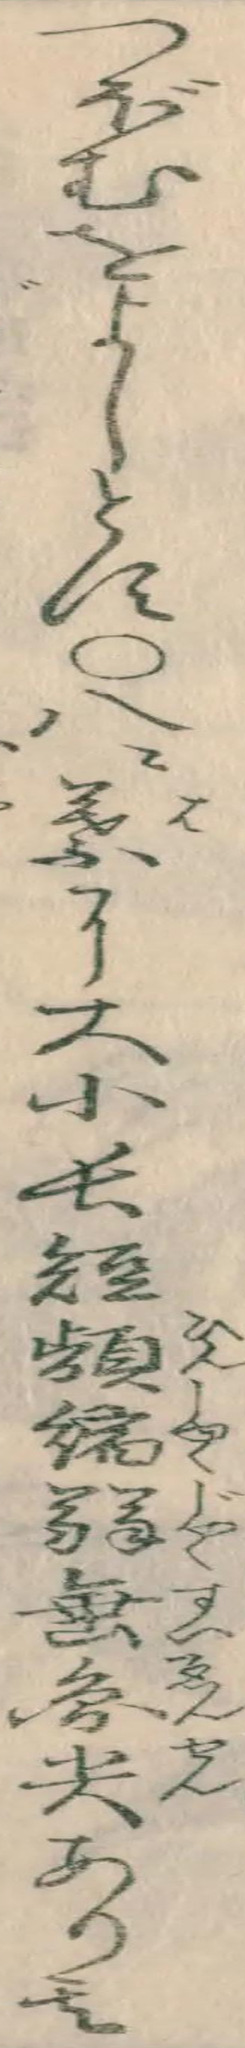つぼむをよしとす○八葉に大小長短頻縮弱垂円尖あり其
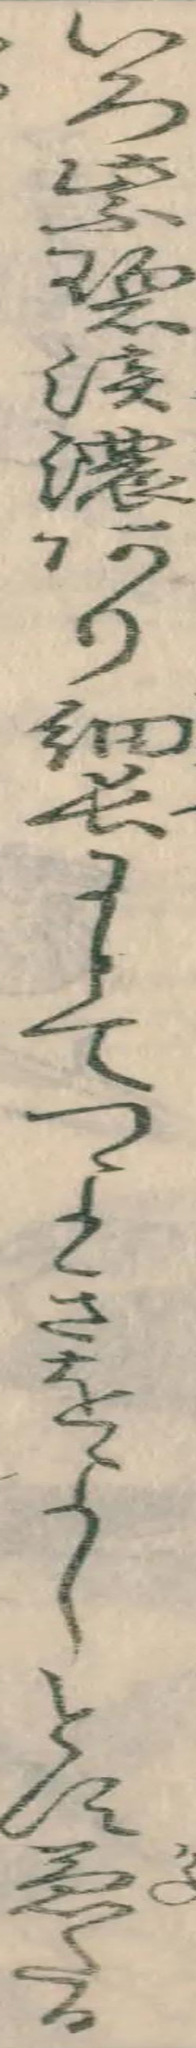いろ紫碧淡濃あり細長にしてつよきをよしとす兼たる
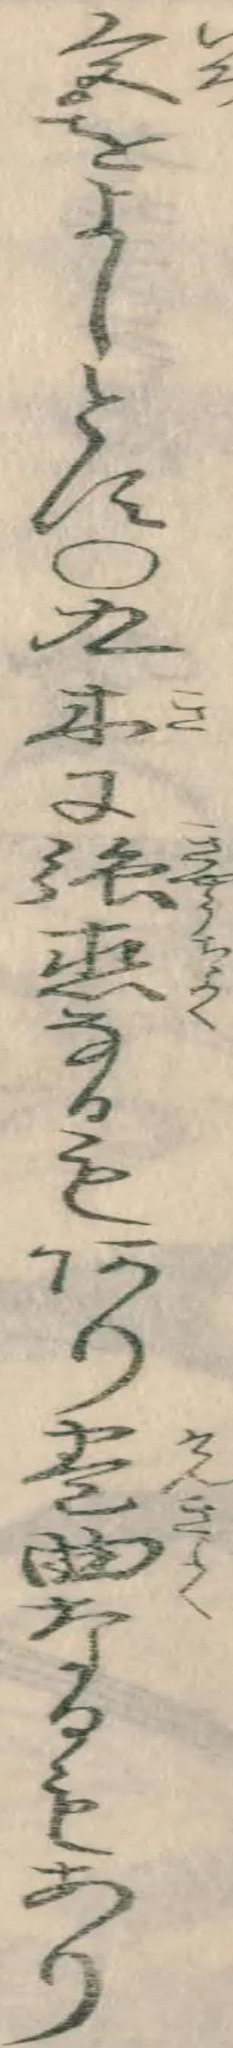色をよしとす○九木に強直なるもあり巻曲なるもあり
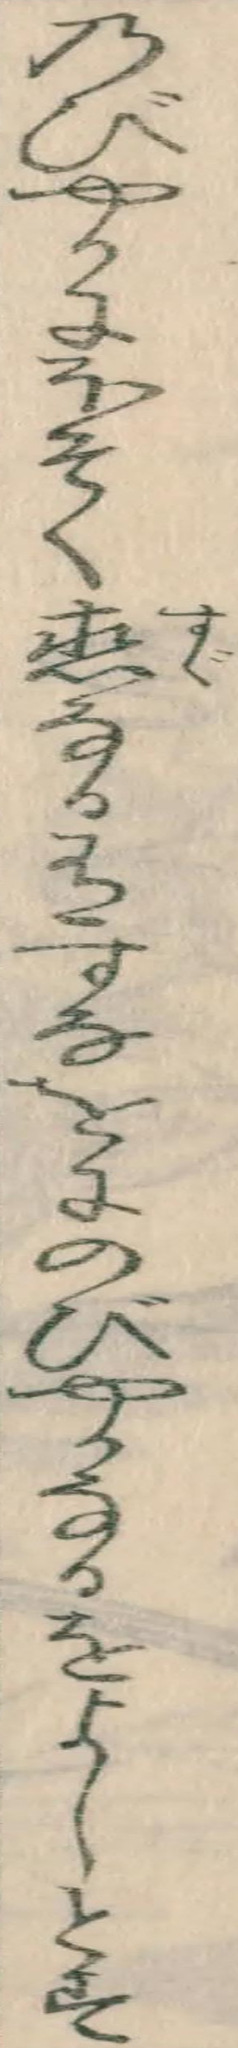のびやかにほそく直なる有すなをにのびやかなるをよしとす
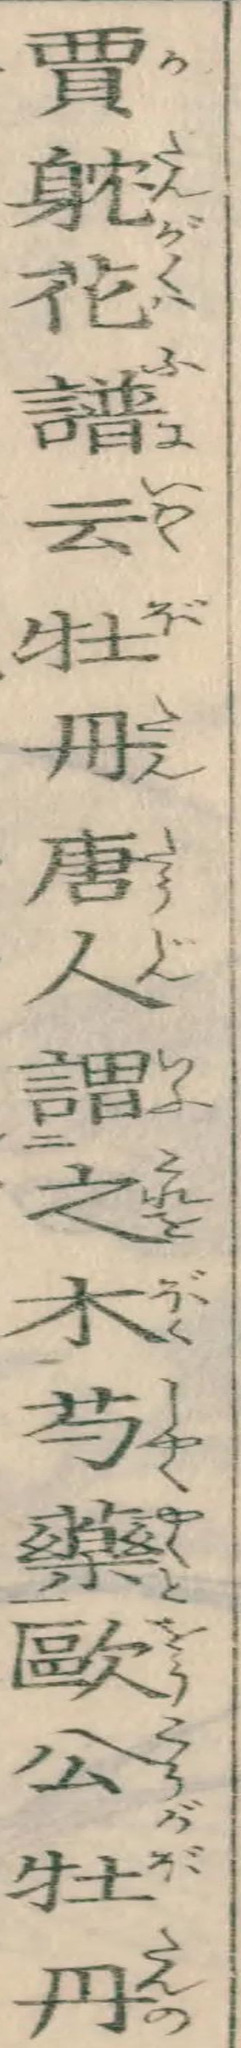賈耽花譜云牡丹唐人謂之木芍薬欧公牡丹
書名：畫本野山草. [5]
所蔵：国立国会図書館 National Diet Library, JAPAN
